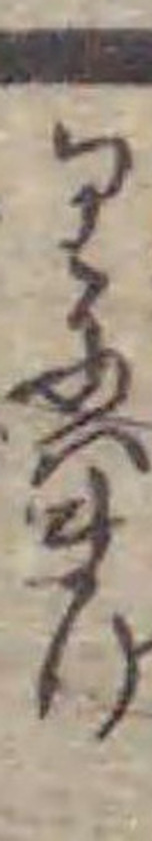りにはまけ
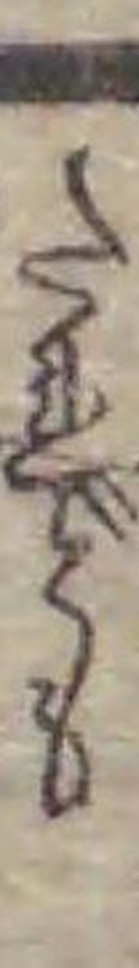たれども
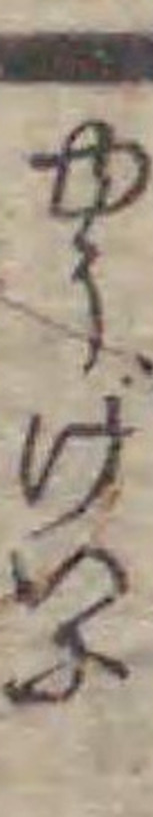ゆうけいに
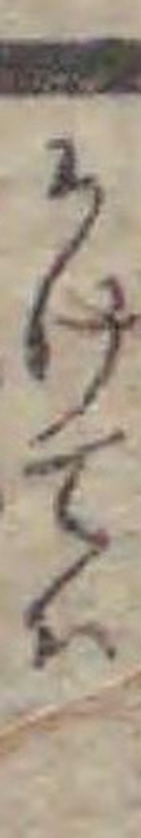かけては
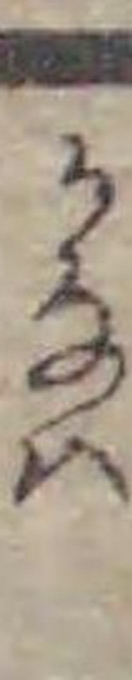かなは
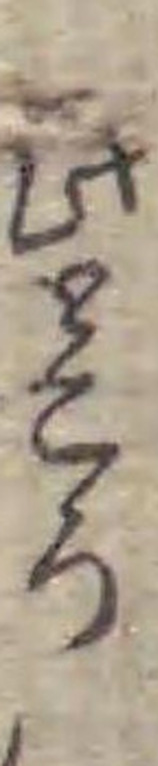此ところ
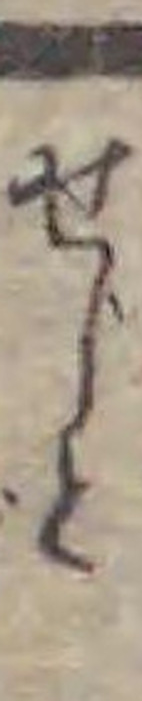せじと
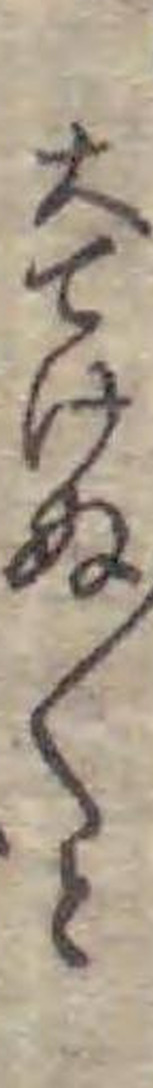おゝてけぬ〳〵と
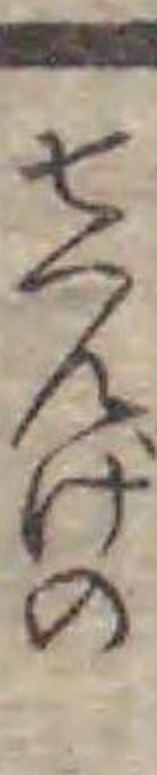七へんげの
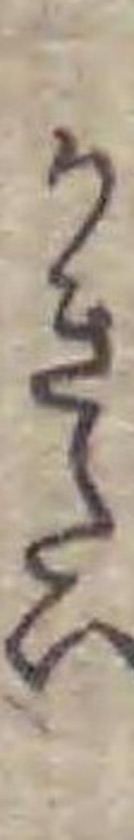かきたい
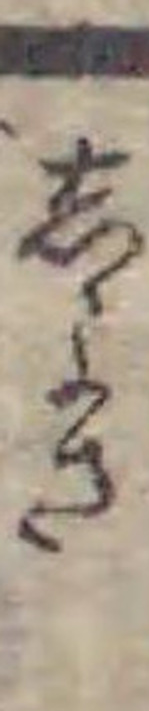しよさ
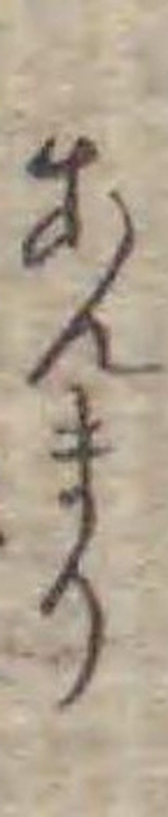あんまり
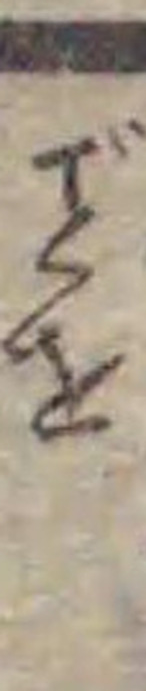ごとを
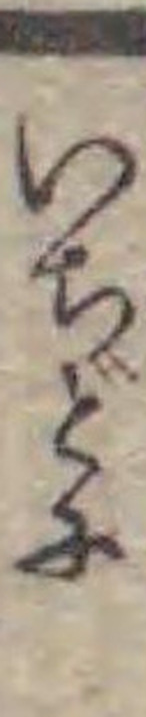いちどに
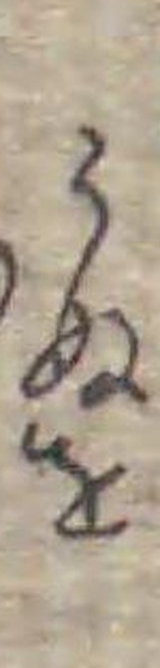うぬを
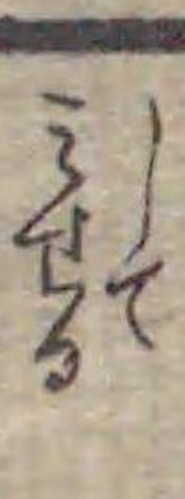みせる
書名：時代世話二挺皷 : 2巻
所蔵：国立国会図書館 National Diet Library, JAPAN
